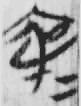身竆
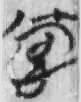○（尚）
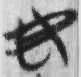母
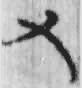又（有）
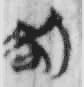咎
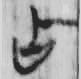占
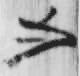之
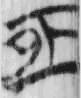亙（恆）
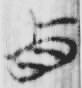貞
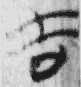吉
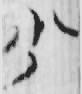少
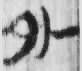外
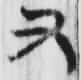又（有）
